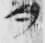月
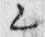乙
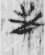未
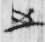之
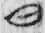日
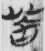蓍
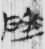陵
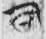司
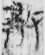敗
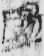○（陽）
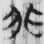非
